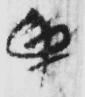身
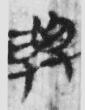與
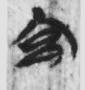宮
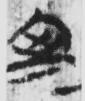室
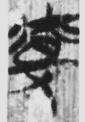○（且）
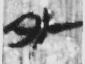外
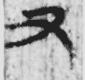又（有）
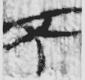不
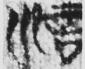訓（順）
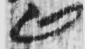㠯（以）
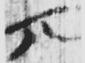亓（其）
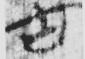古（故）
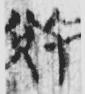敓
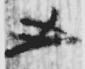之
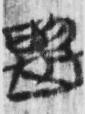○（舉）
